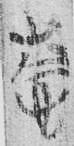情
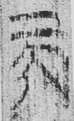而
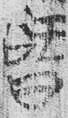智（知）
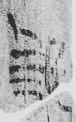○（察）
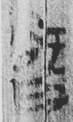智（知）
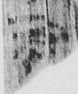而
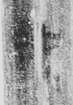神
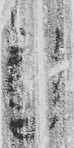○（察）
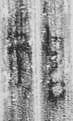神
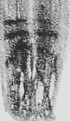而
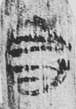同
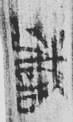○（察）
